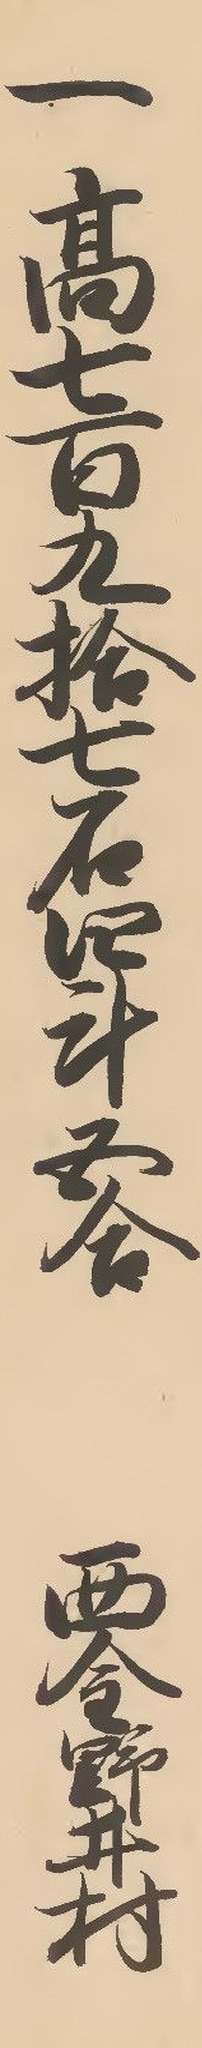一高七百九拾七石四斗五合西金野井村

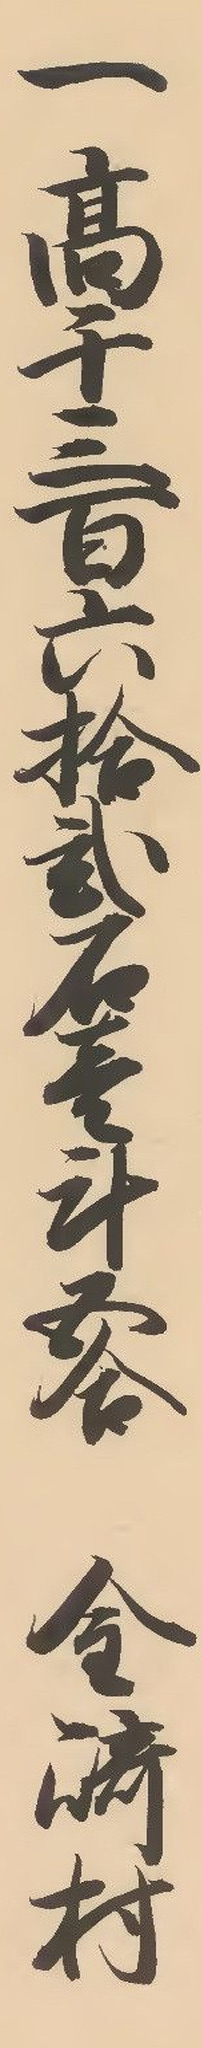一高千三百六拾弐石壱斗五合金崎村
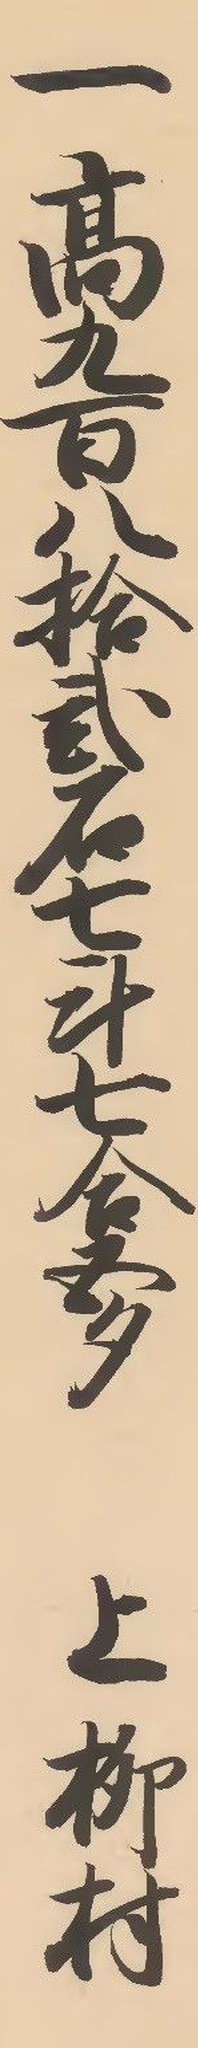一高九百八拾弐石七斗七合五勺上柳村
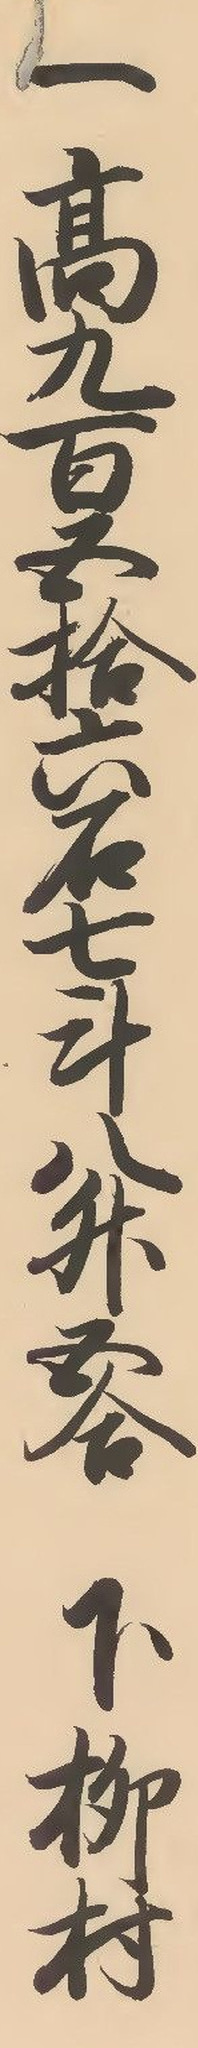一高九百五拾六石七斗八升五合下柳村
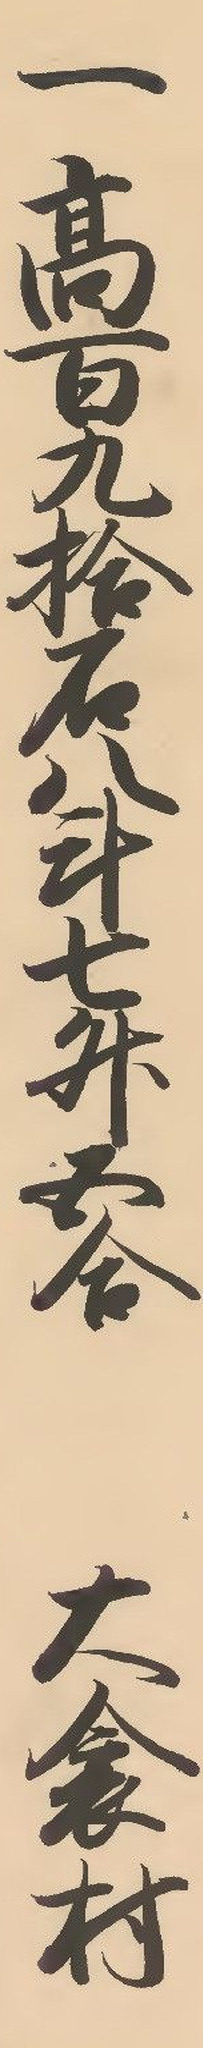一高百九拾石八斗七升五合大衾村
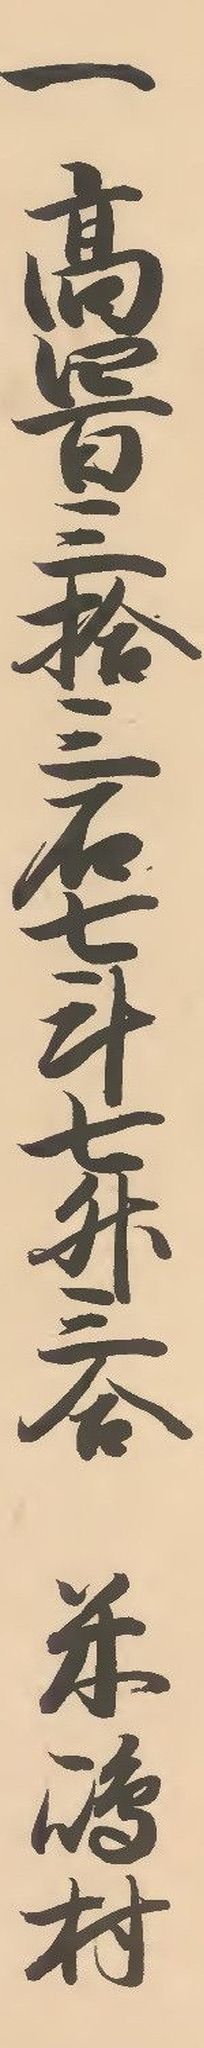一高四百三拾三石七斗七升三合米島村
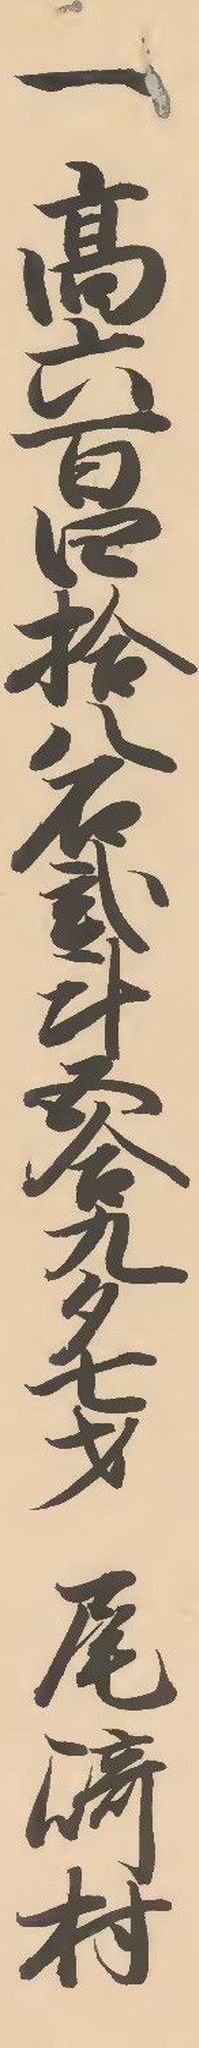一高六百四拾八石弐斗五合九勺七才尾崎村
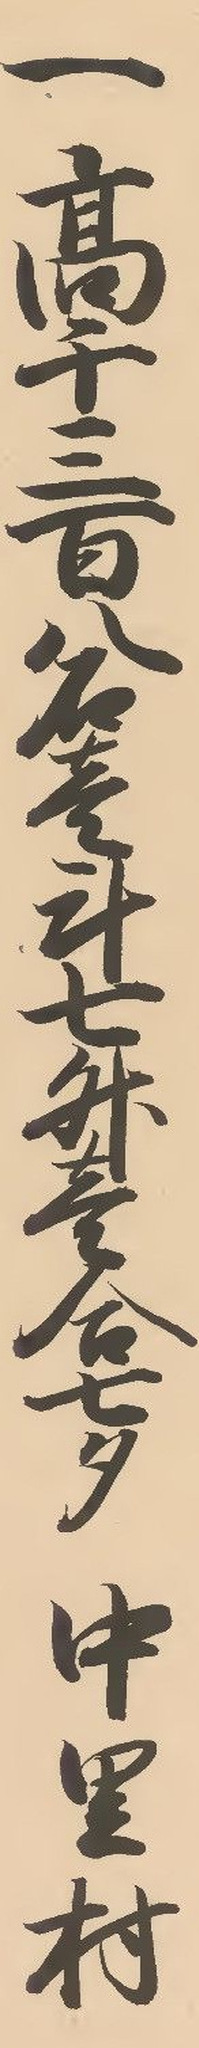一高千三百八石壱斗七升壱合七勺中里村
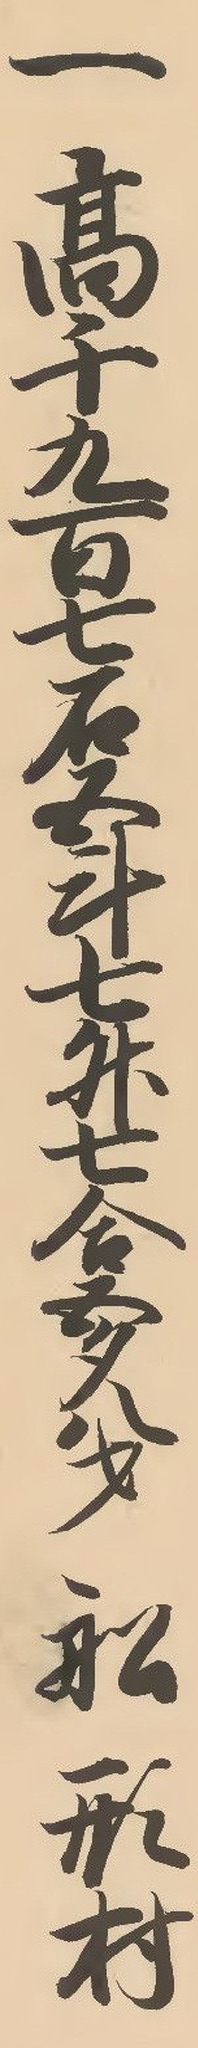一高千九百七石五斗七升七合五勺八才船形村

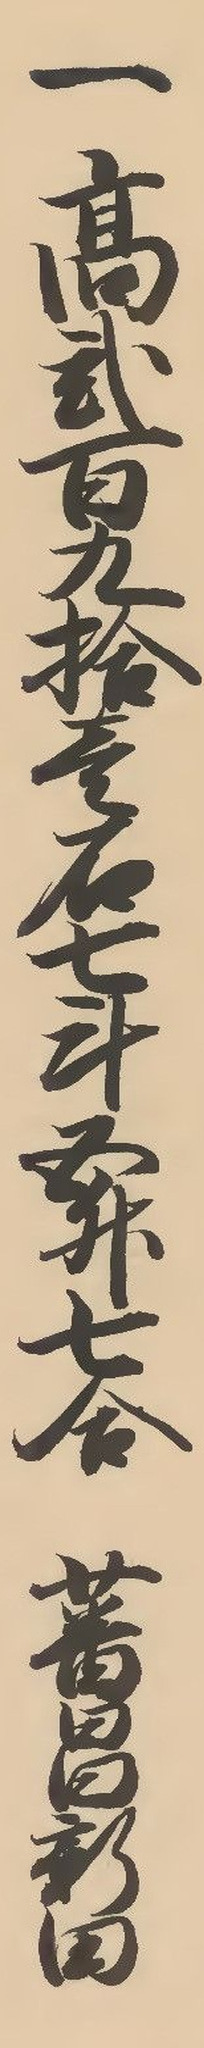一高弐百九拾壱石七斗五升七合蕃昌新田
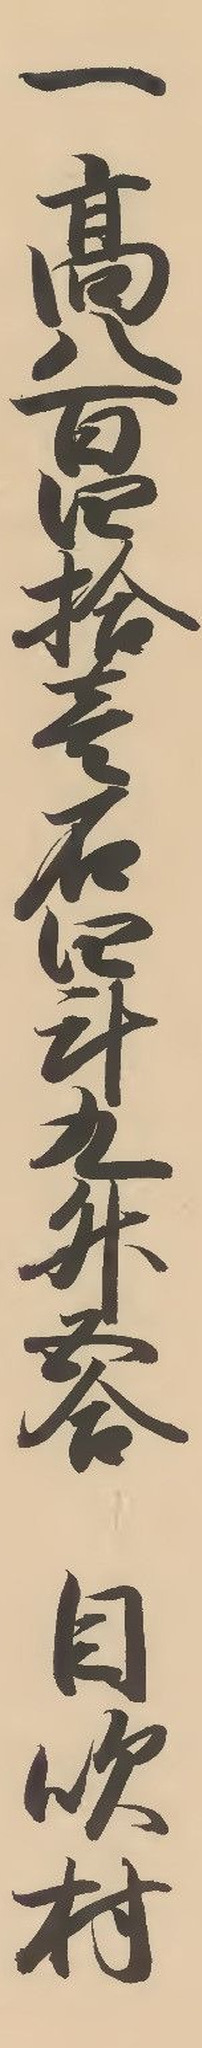一高八百四拾壱石四斗九升五合目吹村
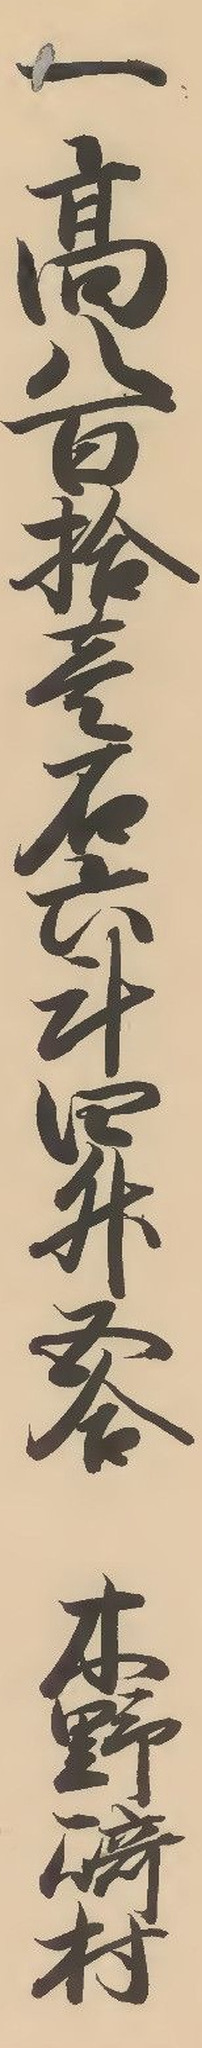一高八百拾壱石六斗四升五合木野崎村
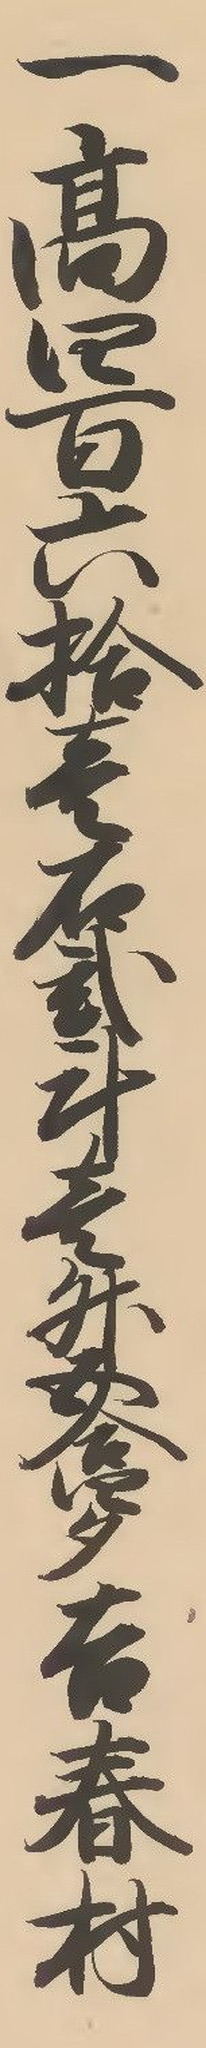一高四百六拾壱石弐斗壱升五合四勺吉春村
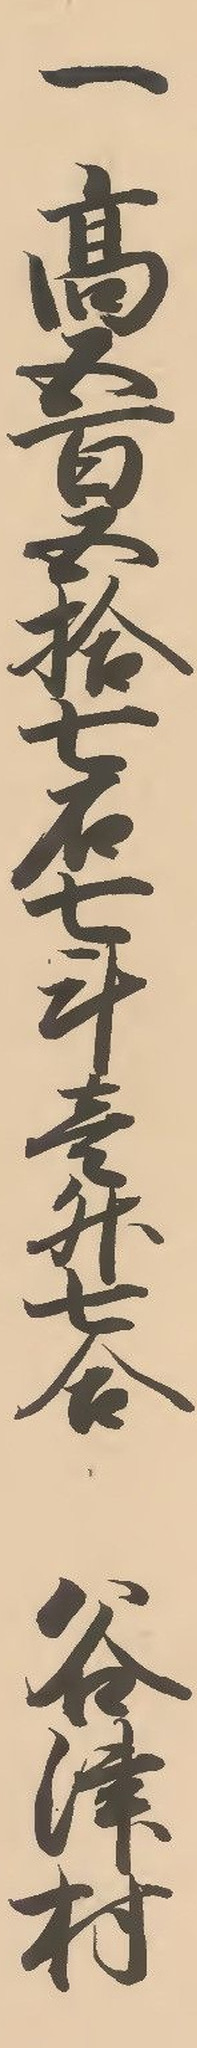一高五百五拾七石七斗壱升七合谷津村
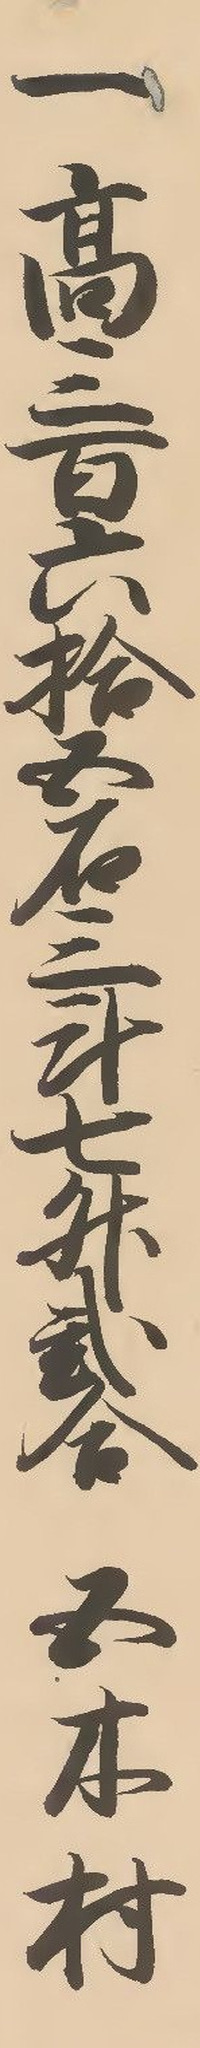一高三百六拾五石三斗七升弐合五木村
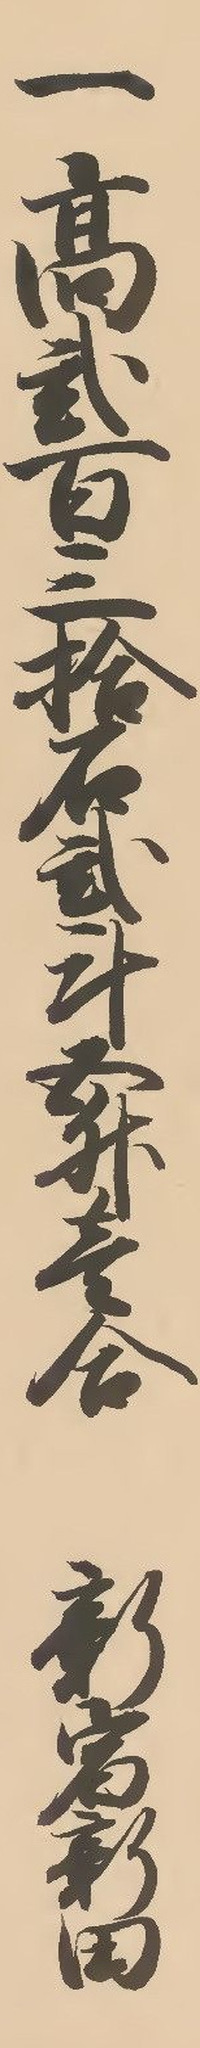一高弐百三拾石弐斗五升壱合新宿新田
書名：下総国郷帳
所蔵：国立公文書館 National Archives of Japan
